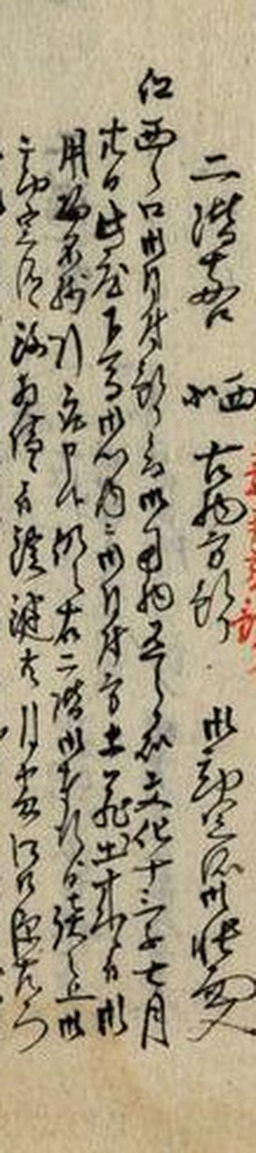廿日此度下馬御門内ニ御目付方土蔵出来候に付御
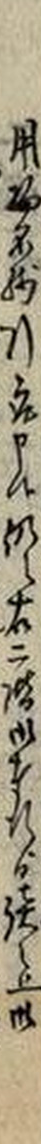用物不残引取申候仍之右二階御奉行ゟ談之上御
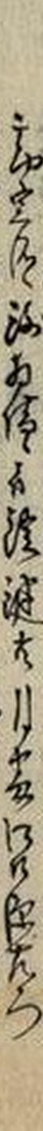勘定所へ致拝借候に付錠鍵共月番江口源左衛門
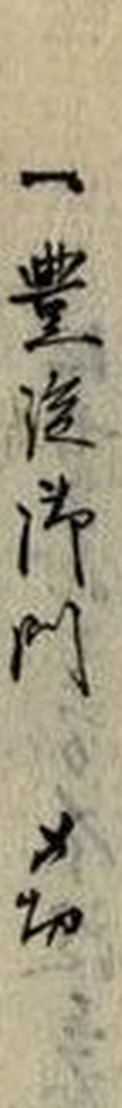一豊後御門〆切
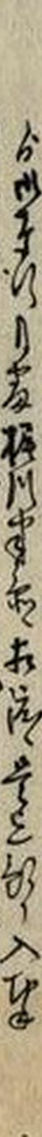ゟ御奉行月番梶川半兵衛へ相渡候是迄預り入切手
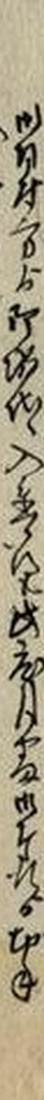御目付方ゟ御城代へ入置候得共此度月番御奉行ゟ切手
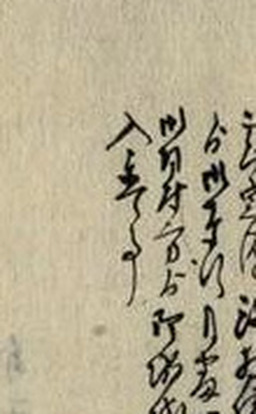入置候事
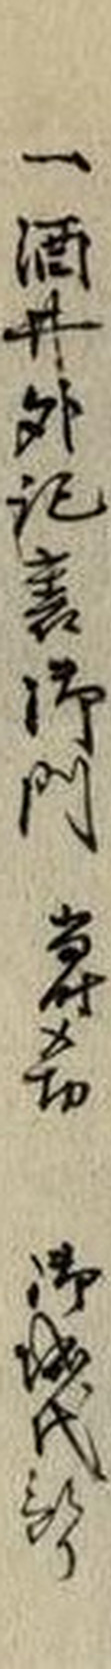一酒井外記裏御門当時〆切御城代預り
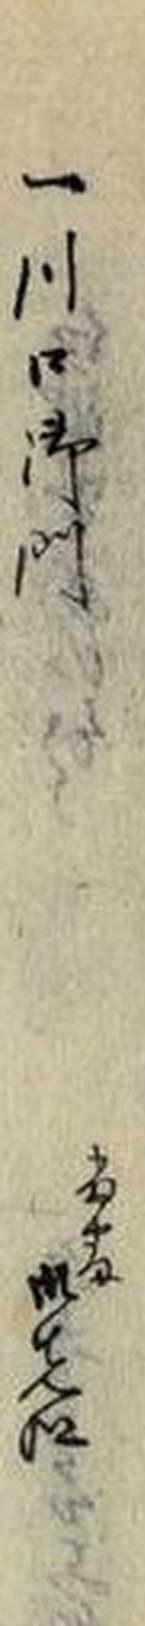一川口御門当番御先組
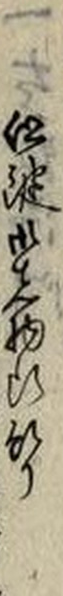但鍵御先物頭預り
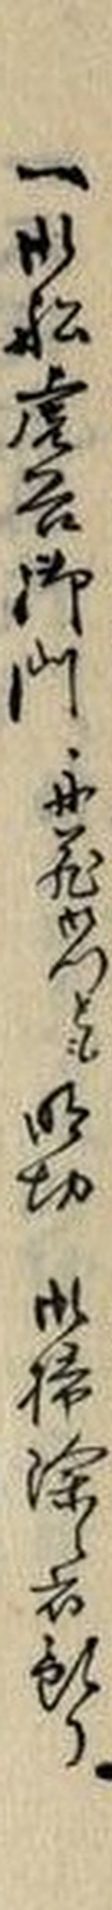一御船虎谷御門舟蔵御門とも明切御掃除之物預り
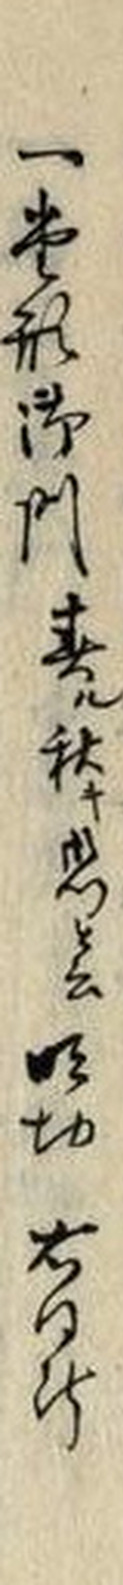一堂形御門春ル秋キ御門と云明切右同断
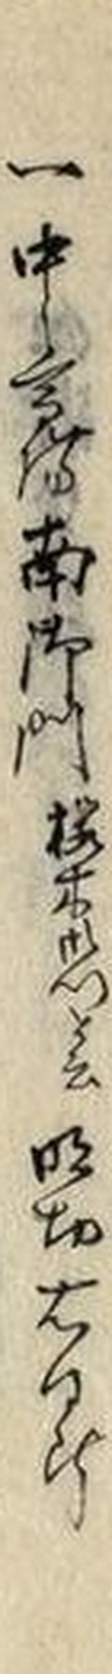一中之馬場南御門桜木御門と云明切右同断
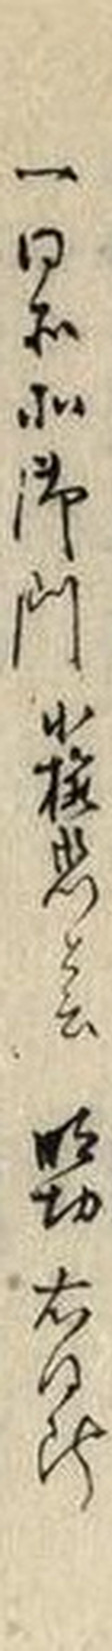一同所北御門小桜御門と云明切右同断
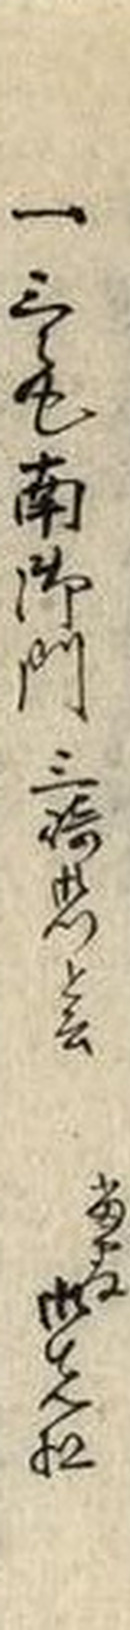一三之丸南御門三崎御門と云当番御先組
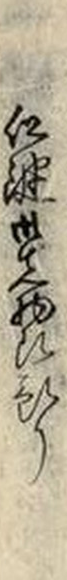但鍵御先物頭預り
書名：御門御櫓之部
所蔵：福井県文書館 Fukui Prefectural Archives
